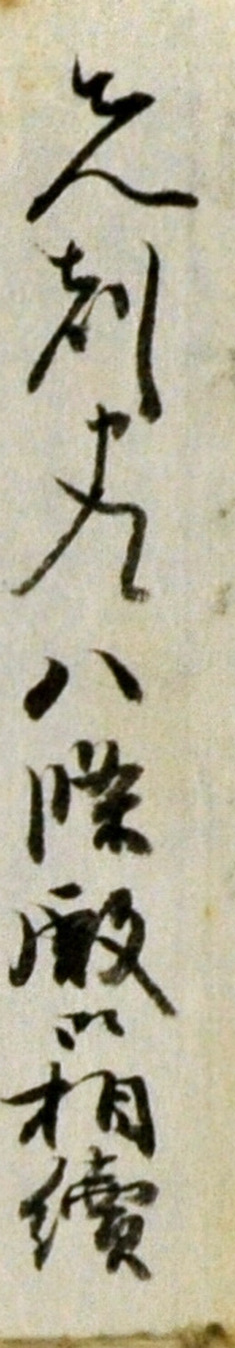先刻申入候八條殿御相続
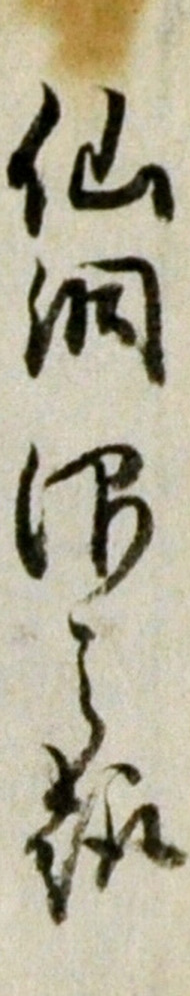仙洞仰之趣
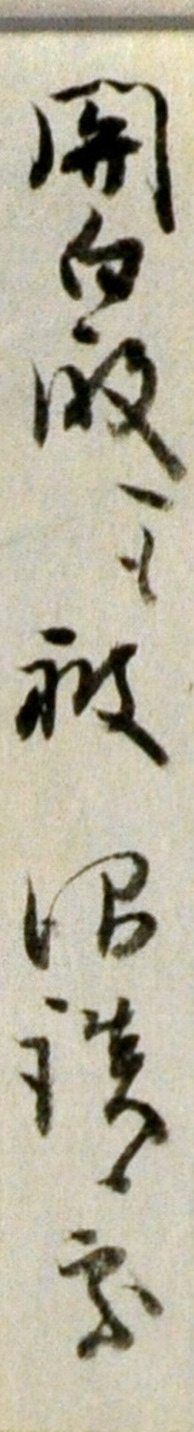関白殿へも被仰談候処
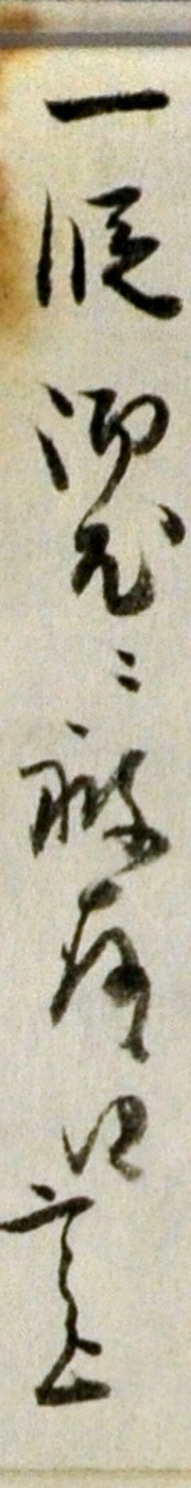一段御尤ニ被存候由言上
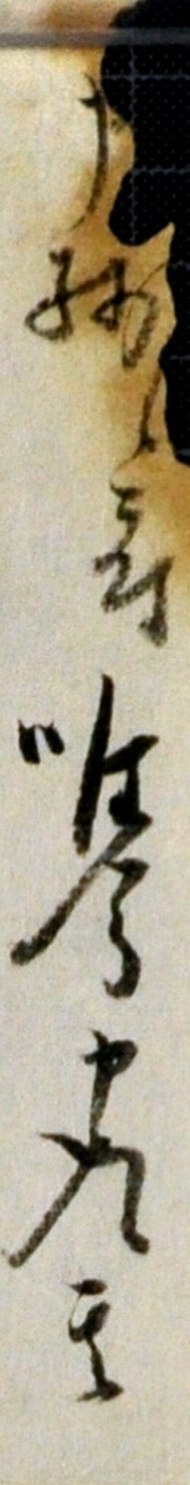申残候ニ付唯今申入候其
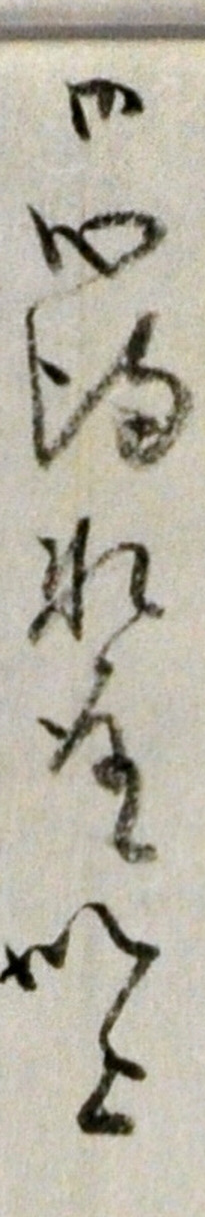御心得願度候以上
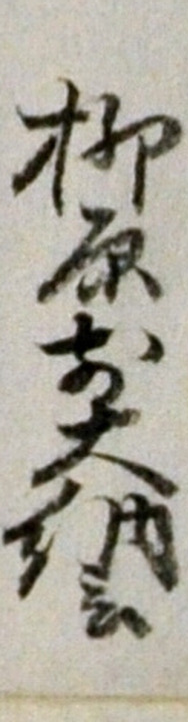柳原前大納言
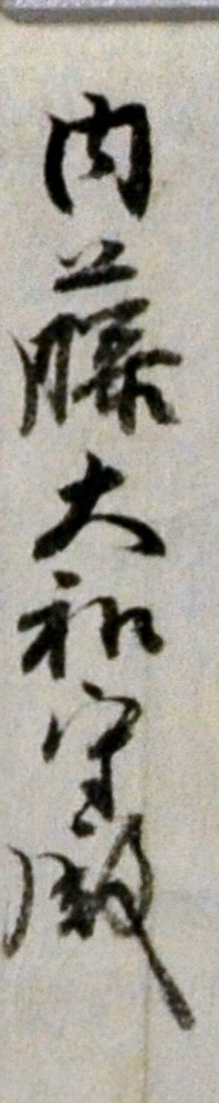内藤大和守殿
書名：書状
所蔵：伊那市立高遠町図書館・合同会社AMANE
